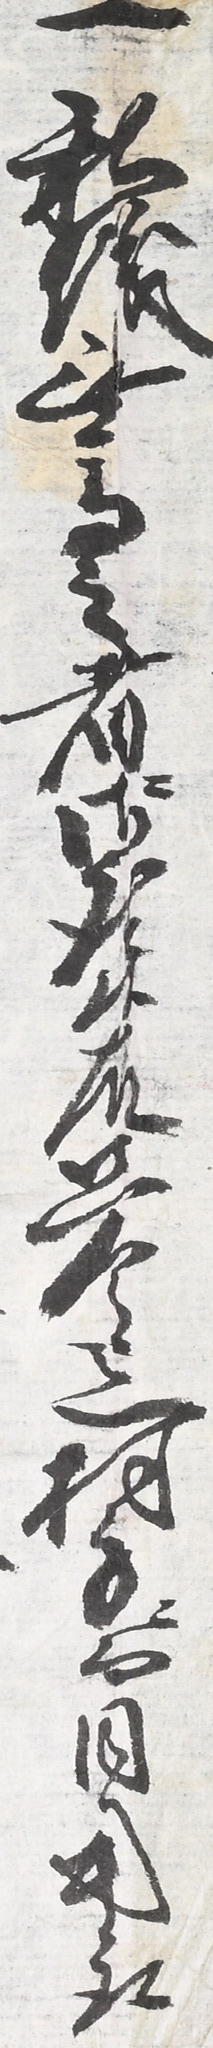一私儀無高之者に御座候故只今迄村方にて日用取
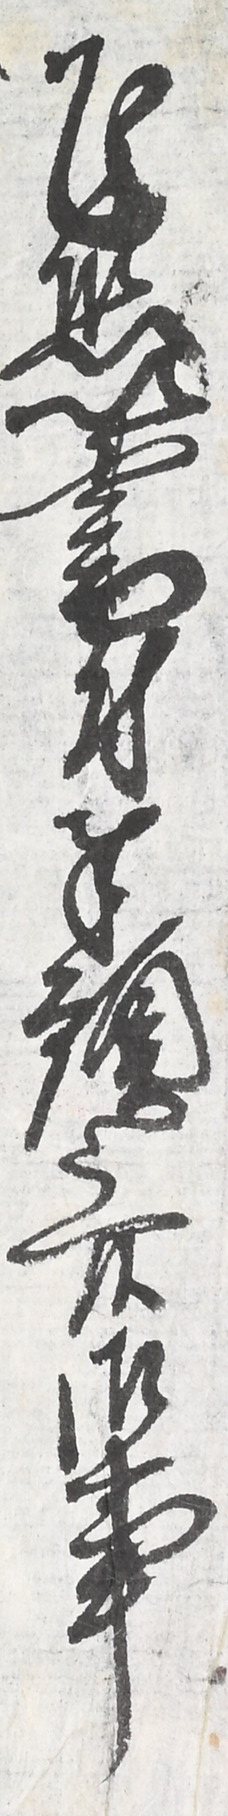乍恐以書付奉願上候御事
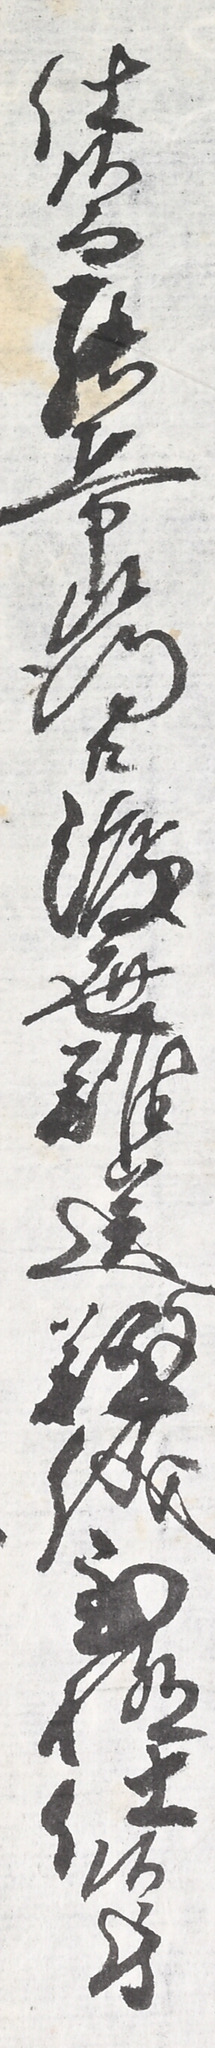仕候て罷在申候得共渡世難送り難儀至極仕候に付
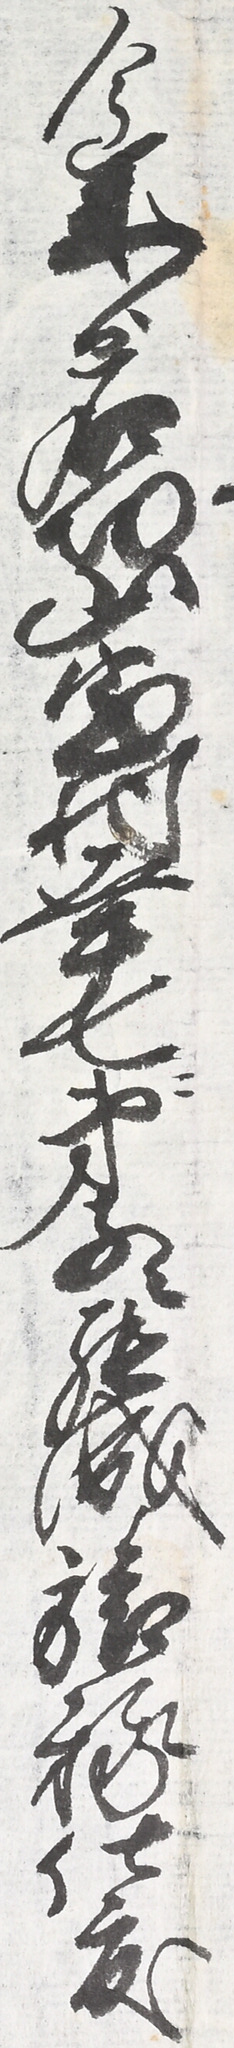今年ゟ石切山室村幸七に弟子に罷成旅稼仕度
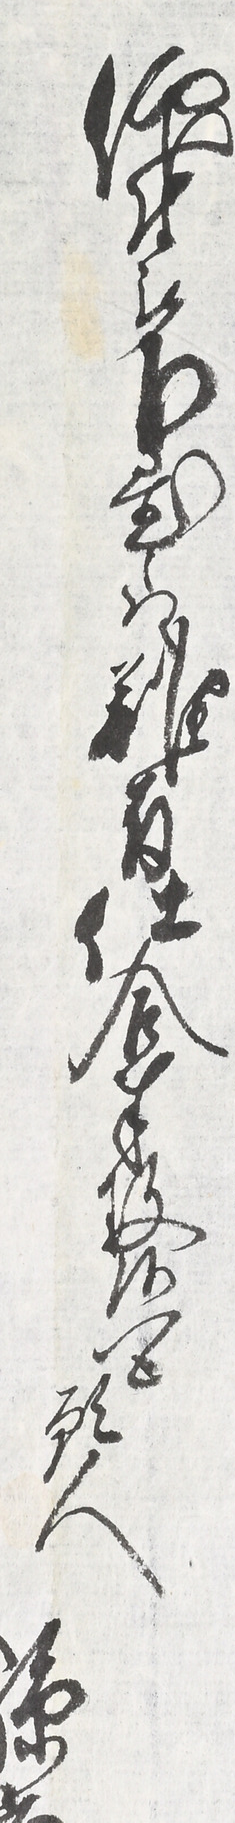仰付被下置候はゝ難有仕合奉存候以上
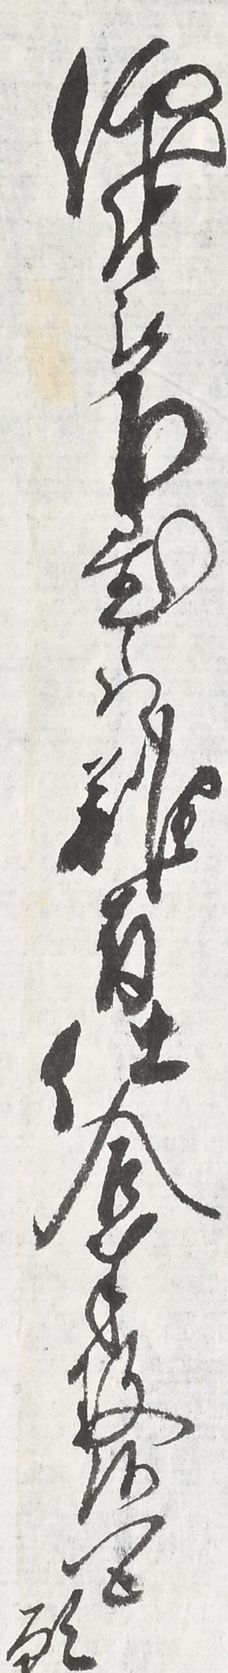仰付被下置候はゝ難有仕合奉存候以上
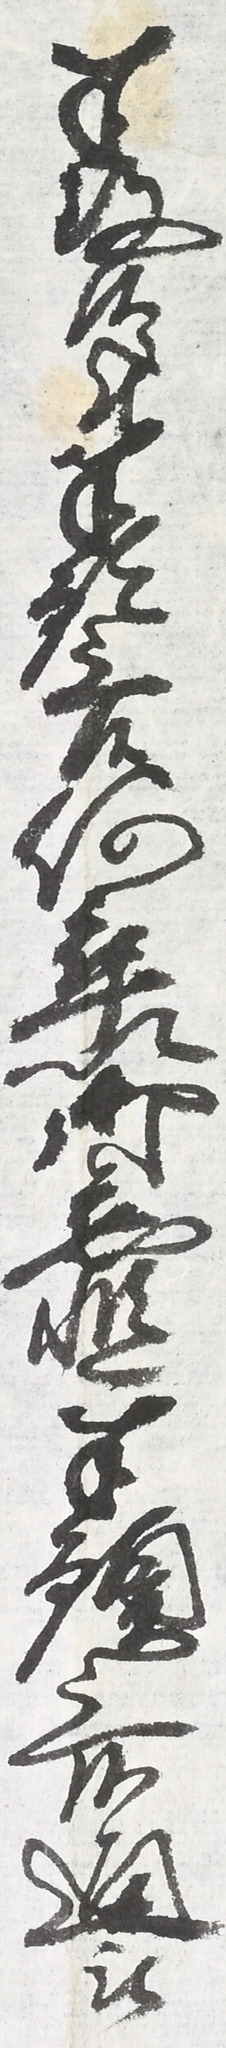奉存候に付奉願上候何卒以御慈悲奉願上候通被
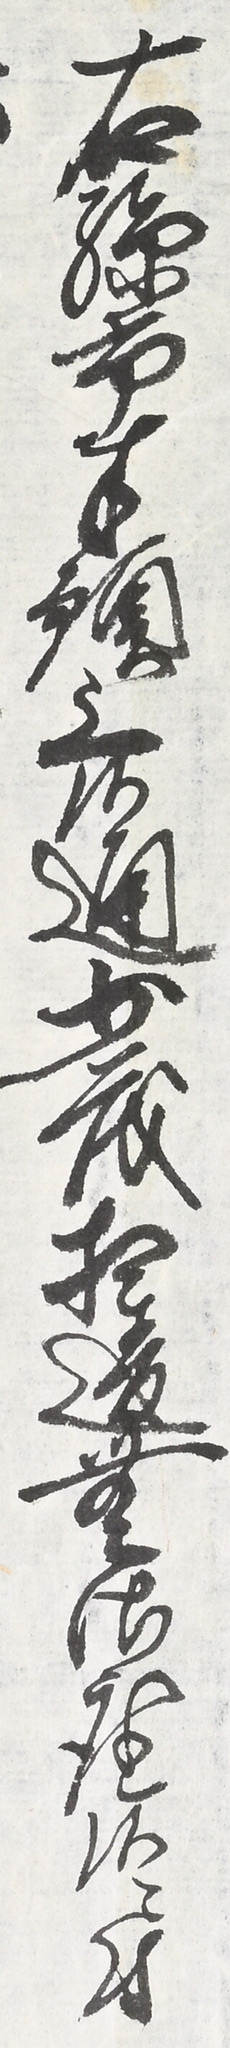右孫市奉願上候通少も相違無御座候に付
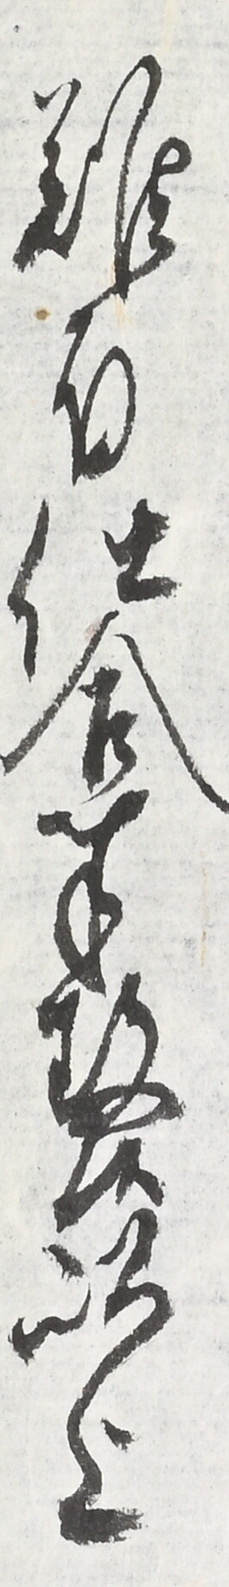難有仕合奉存候以上
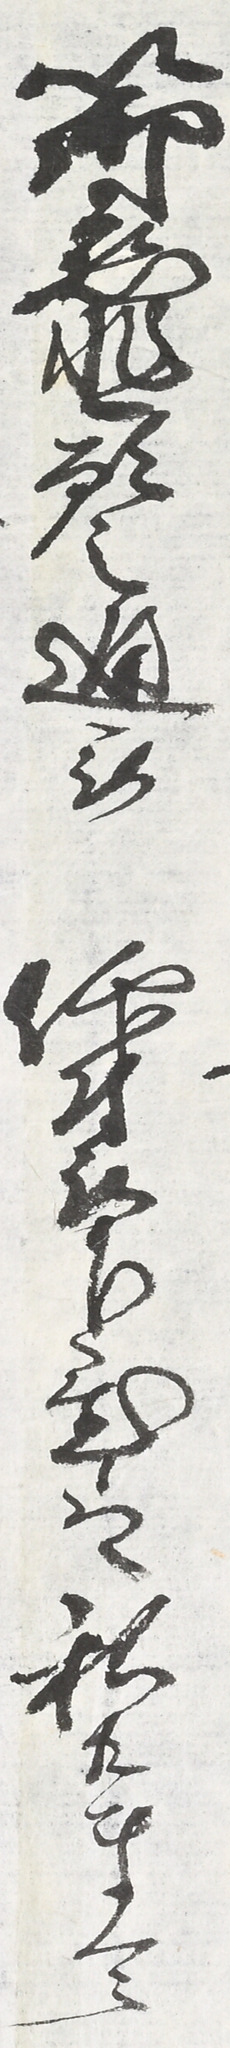以御慈悲願之通被仰付被下置候はゝ私共まて
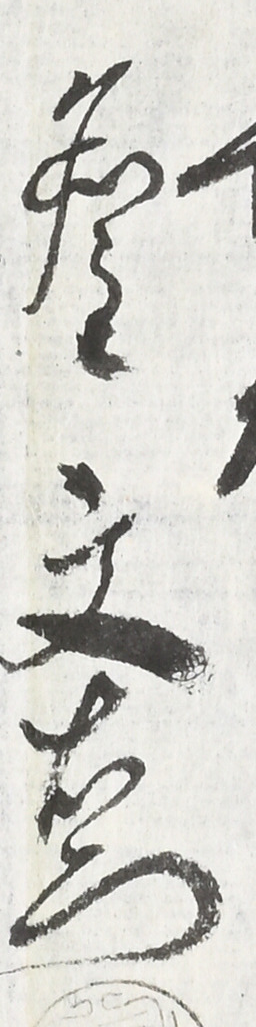名主文右衛門
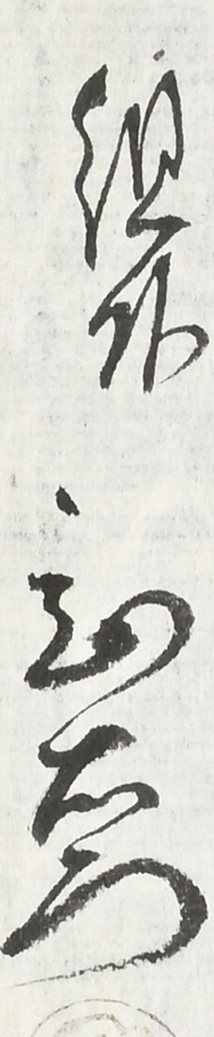組頭甚右衛門
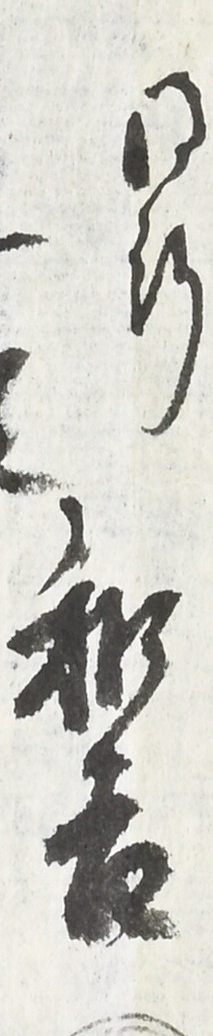同断和吉
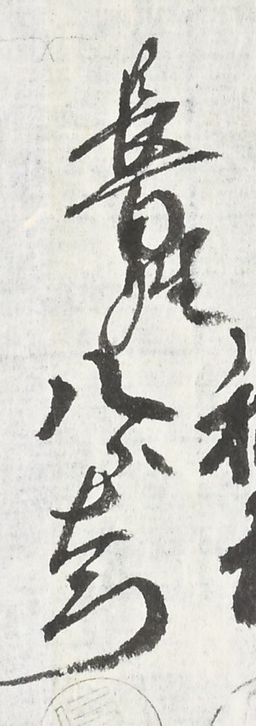長百姓八郎右衛門
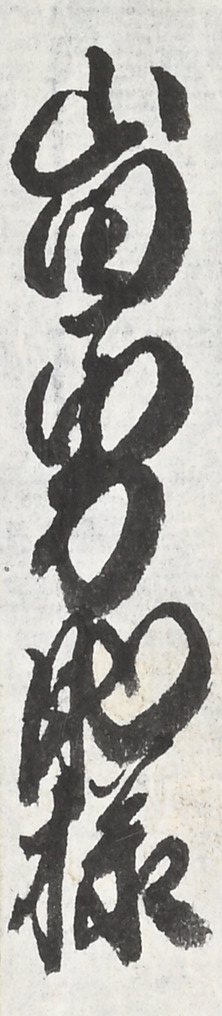山田勇助様
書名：乍恐以書付奉願上候御事
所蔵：伊那市立高遠町図書館・合同会社AMANE
